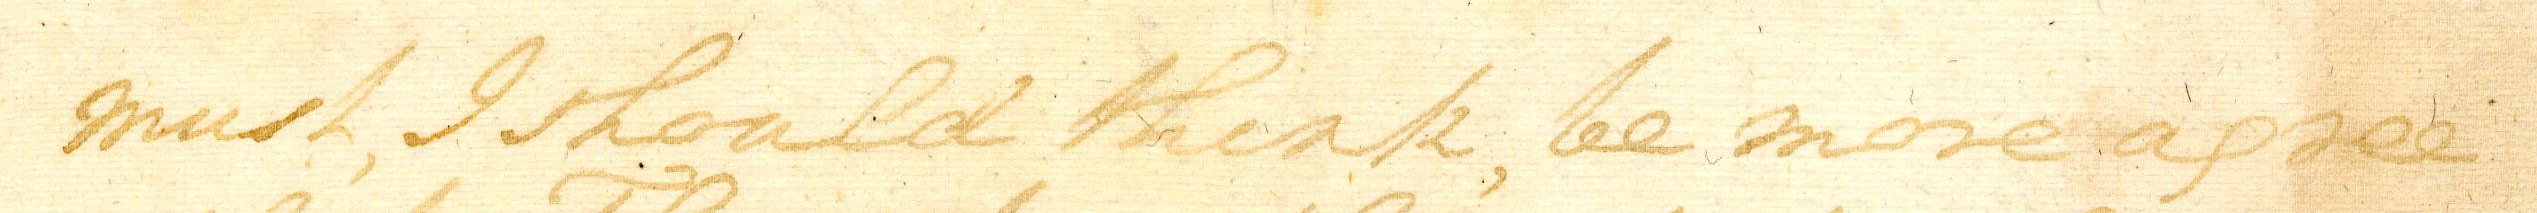must, I should think, be more agree
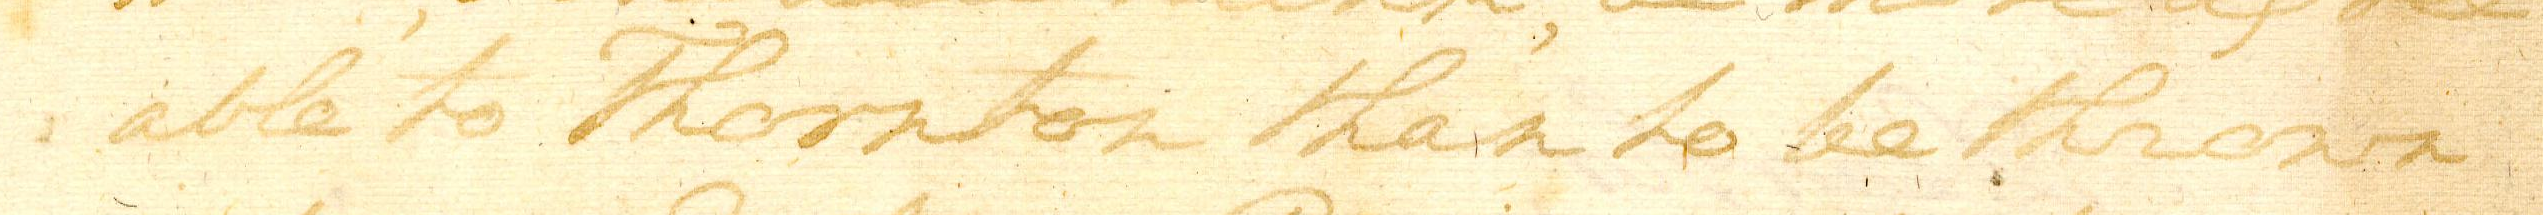able to Thornton than to be thrown
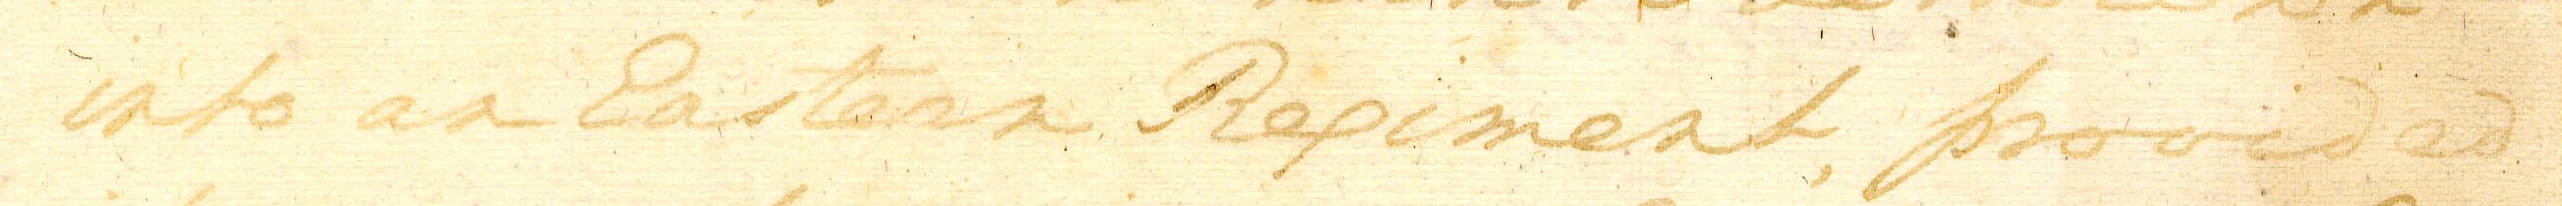into an Eastern Regiment, provided
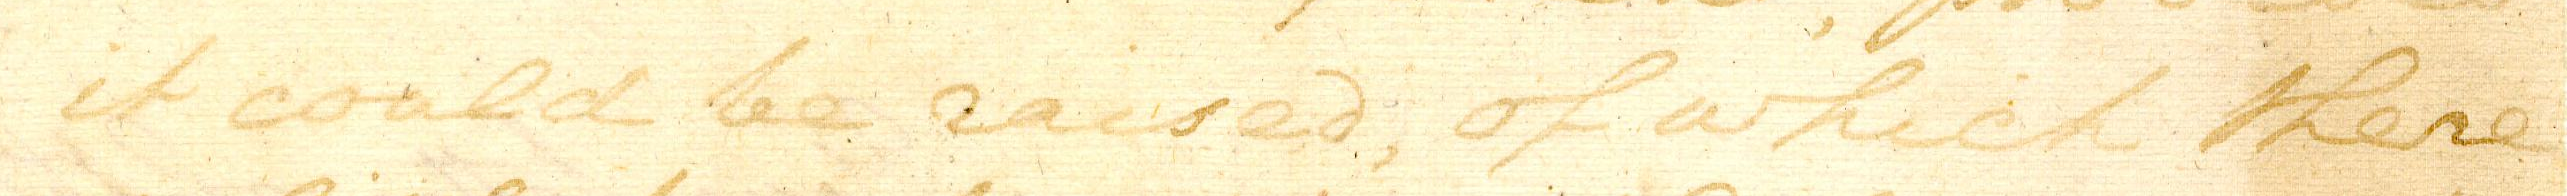it could be raised, of which there
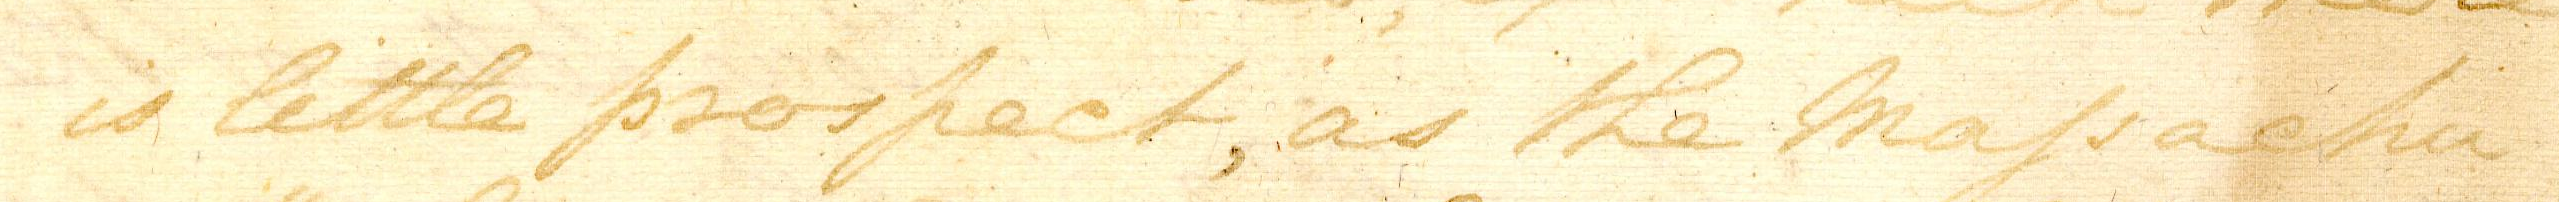is little prospect, as the Massachu
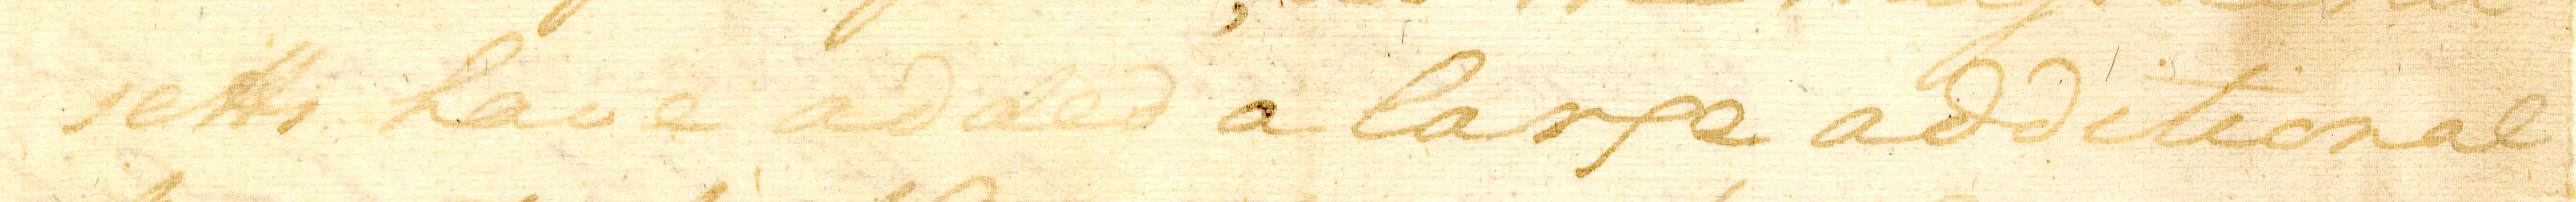setts have added a large additional
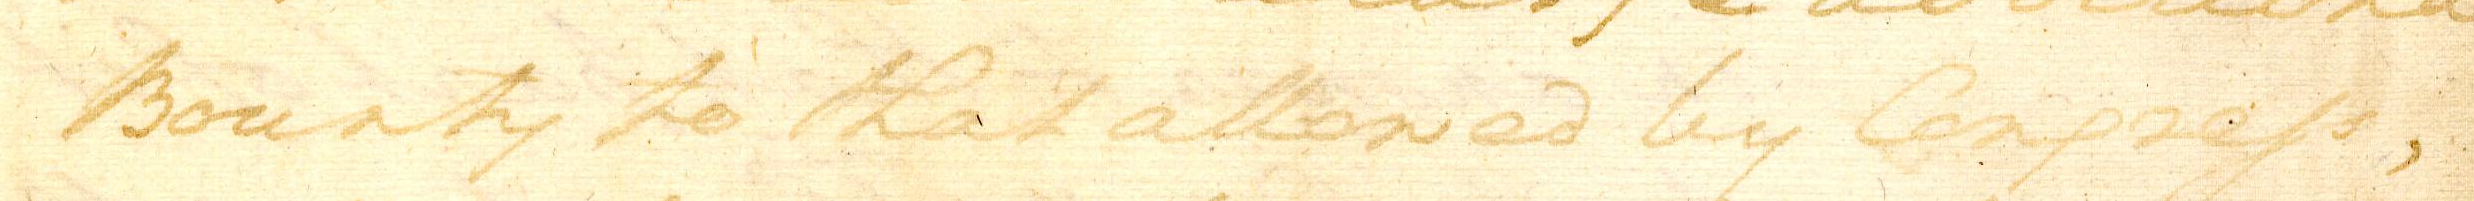Bounty to that allowed by Congress,
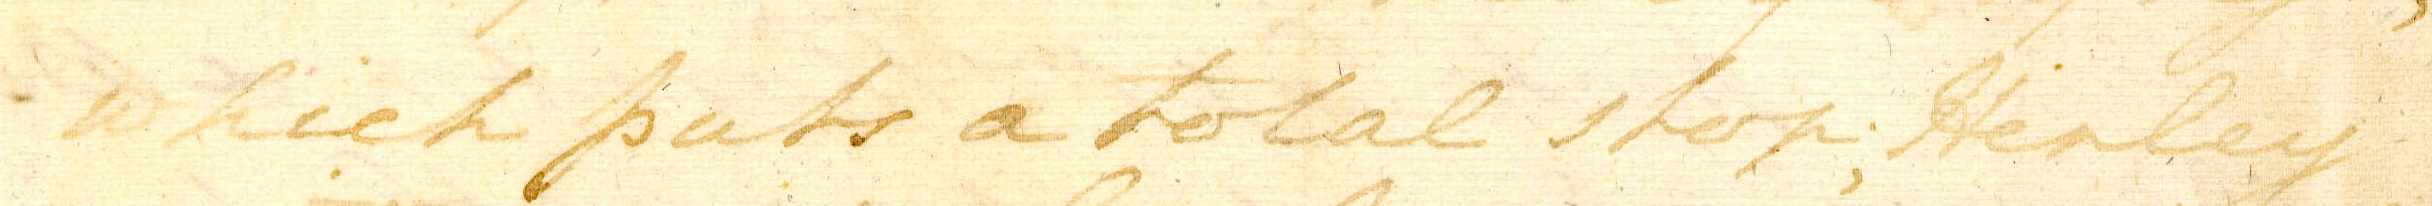which puts a total stop; Henley
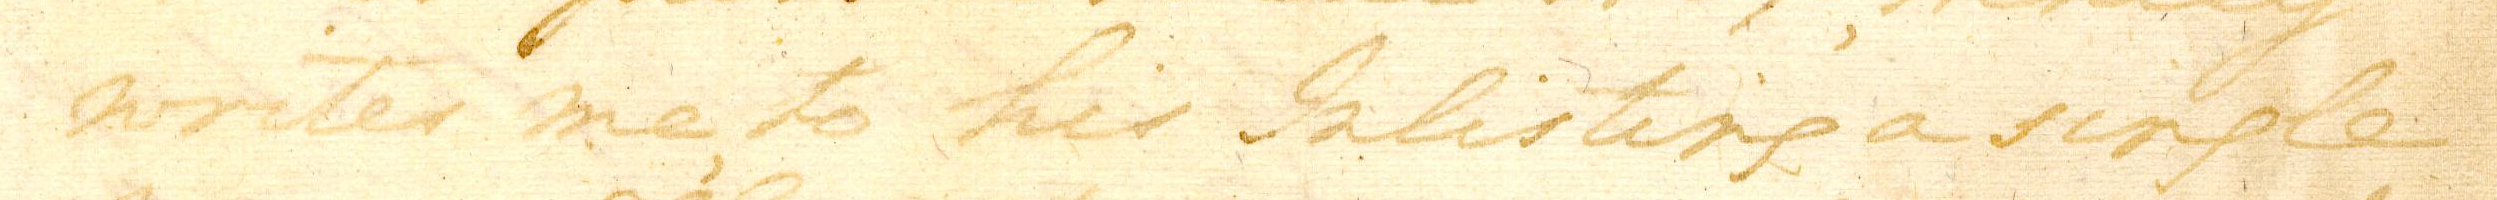writes me to his Inlisting a single
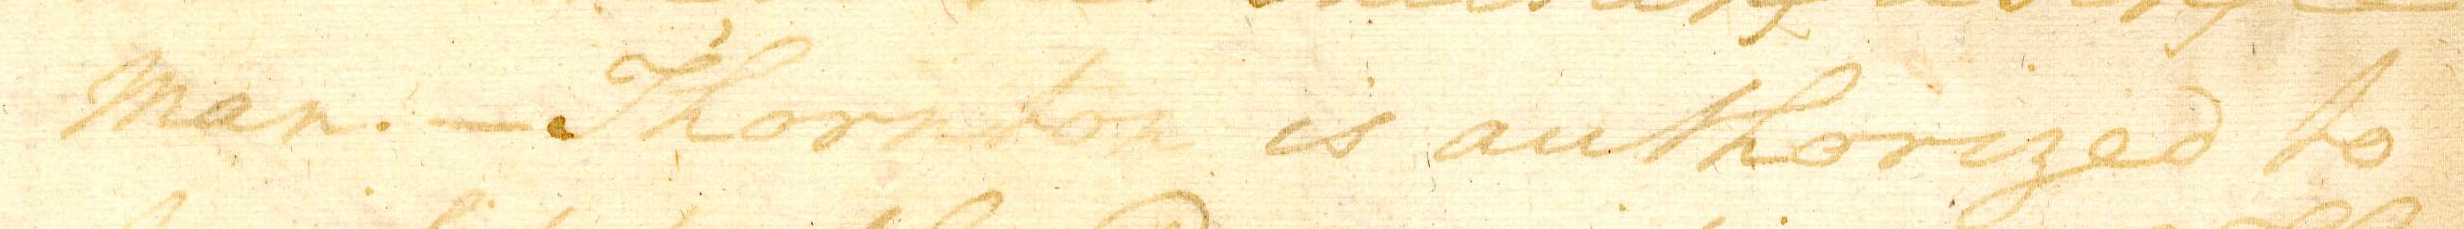man.- Thornton is authorized to
